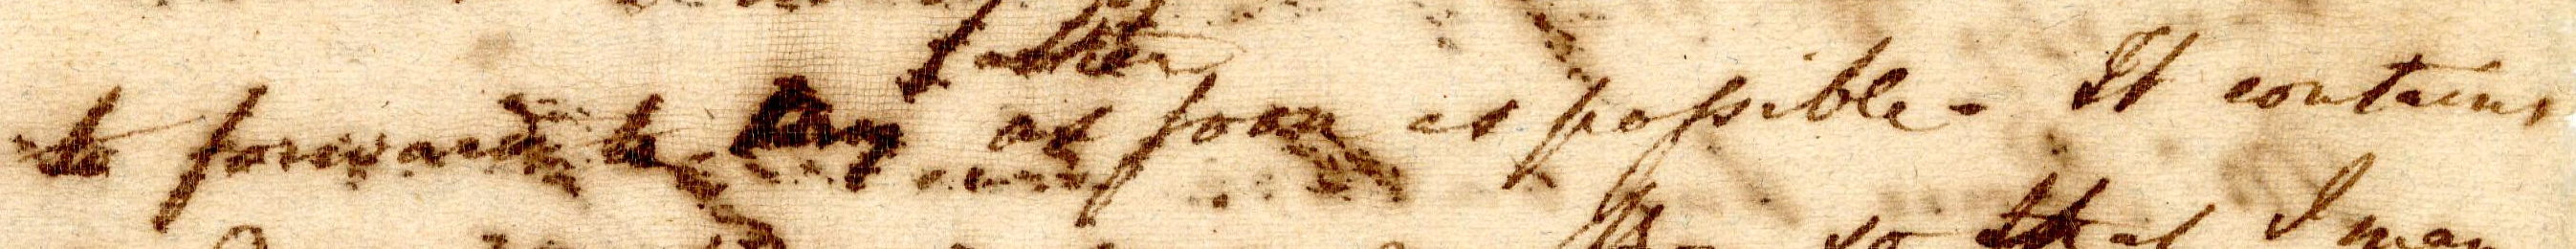to forward to as soon is possible. It contains
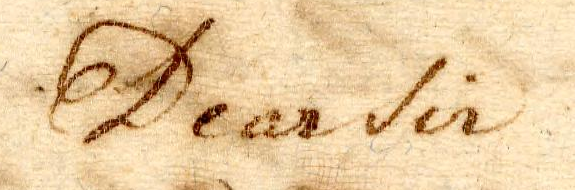Dear Sir
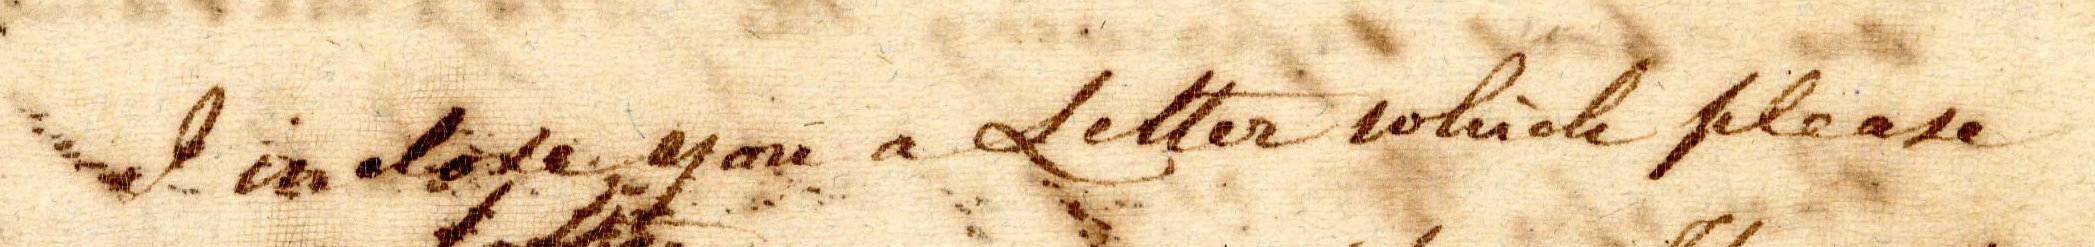I inclose you a Letter which please
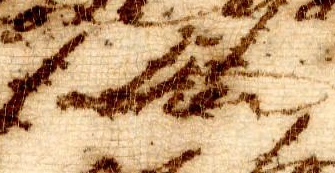after
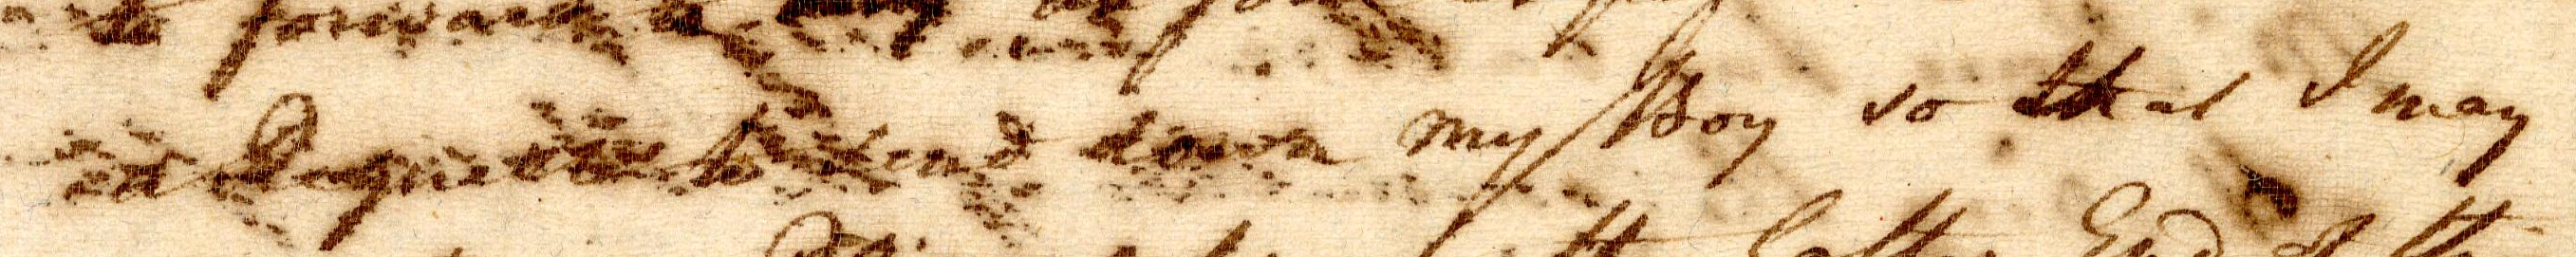a Request to send down my Boy so that I may
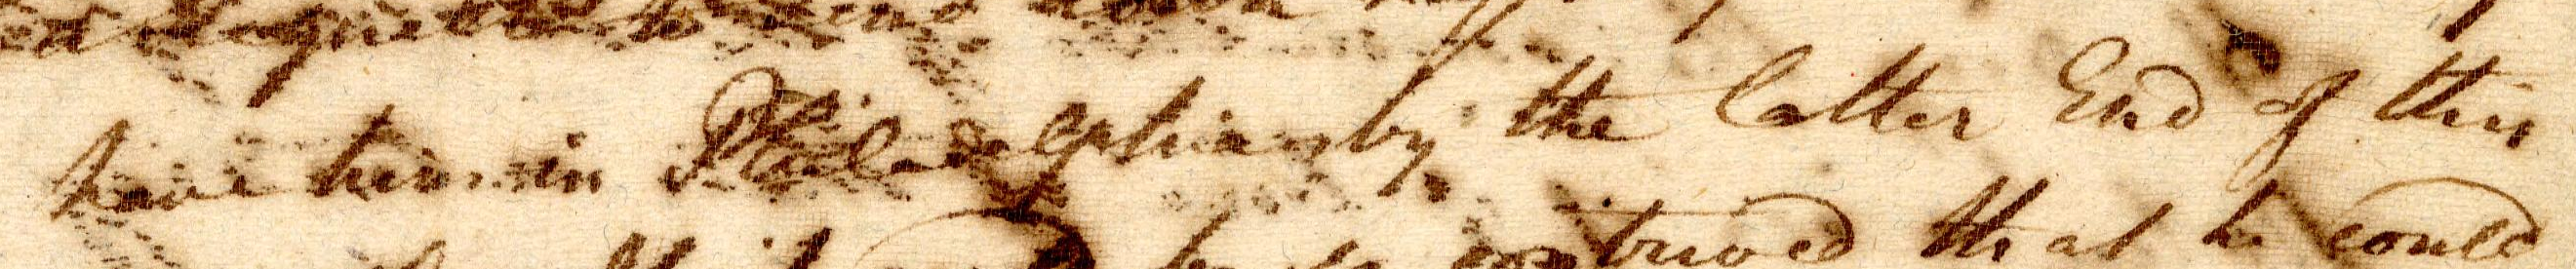have here in Philadelphia by the latter end of this
